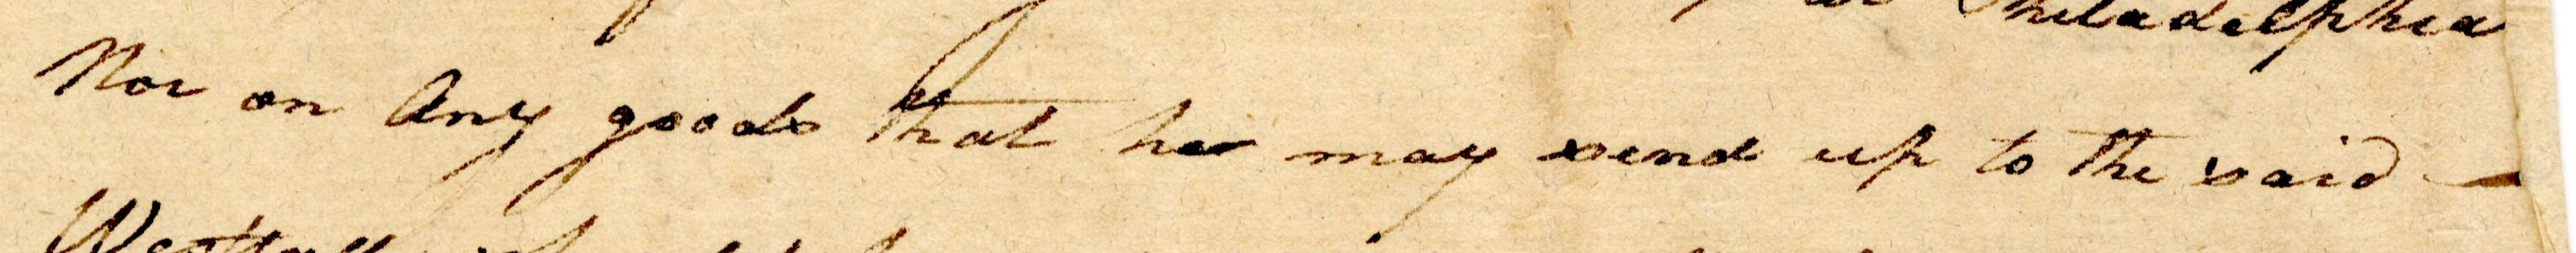Nor on Any goods that he may send up to the said
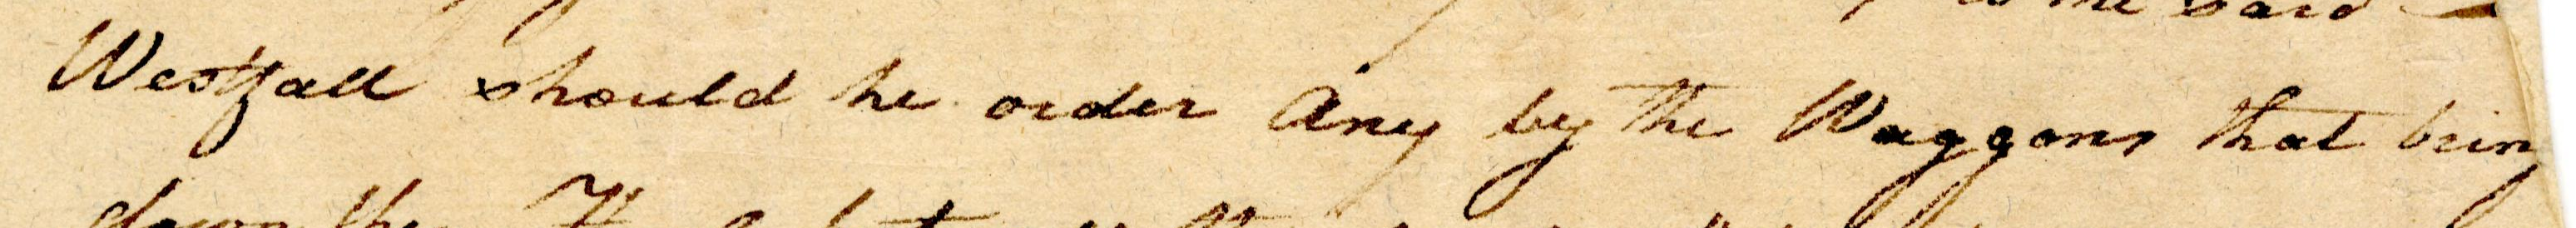Westfall should he order Any by the Waggons that bring
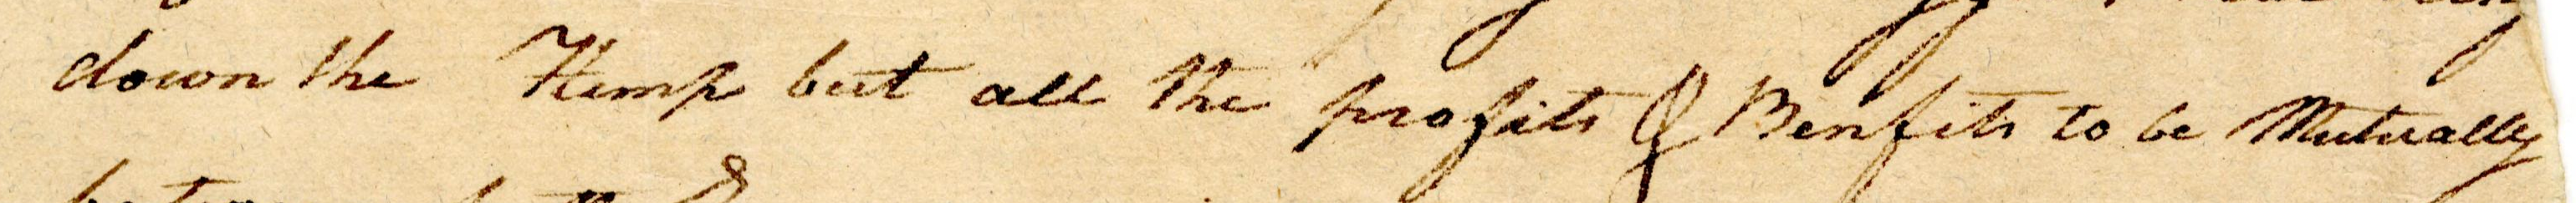down the Hemp but all the profits & Benfits to be Mutually
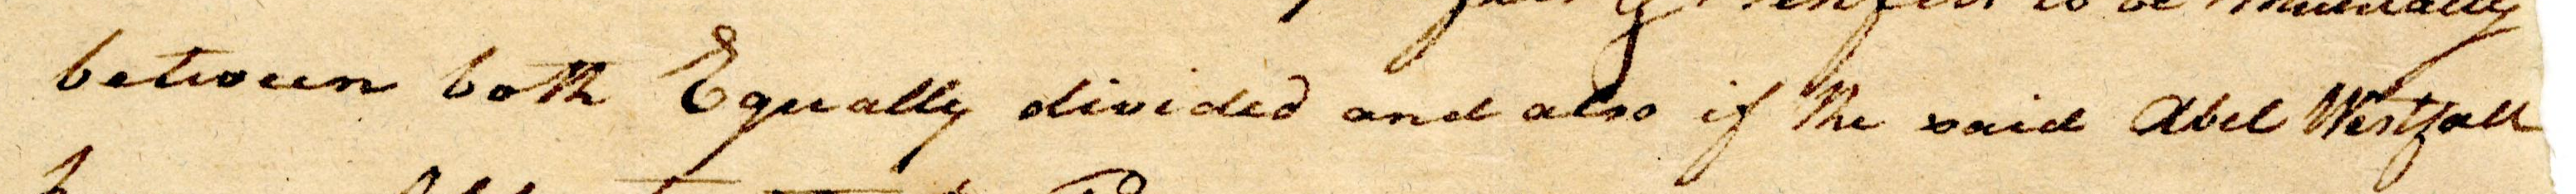between both Equally divided and also if the said Abel Westfall
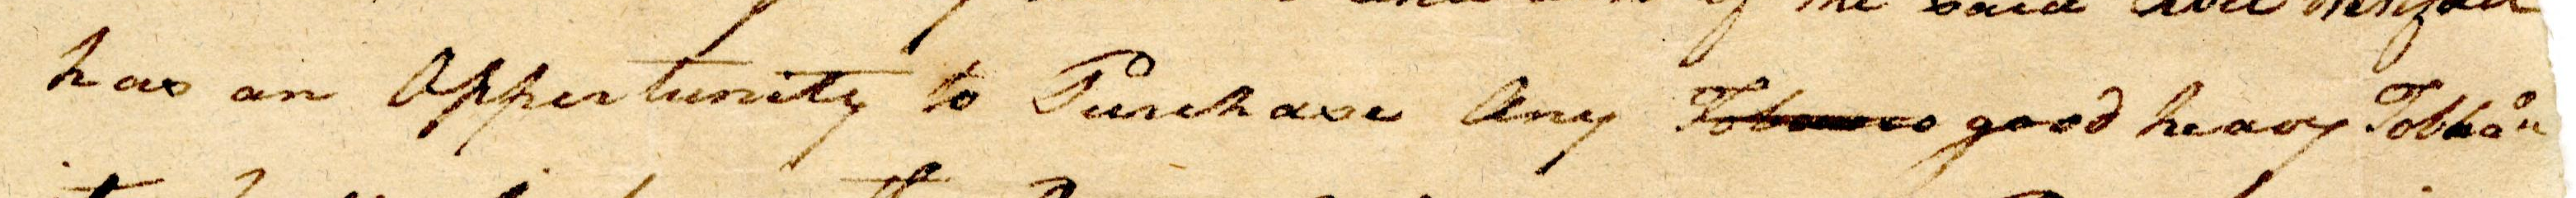has an oppertunity to Purchase any [Tobacco] good heavy Tobba^o.
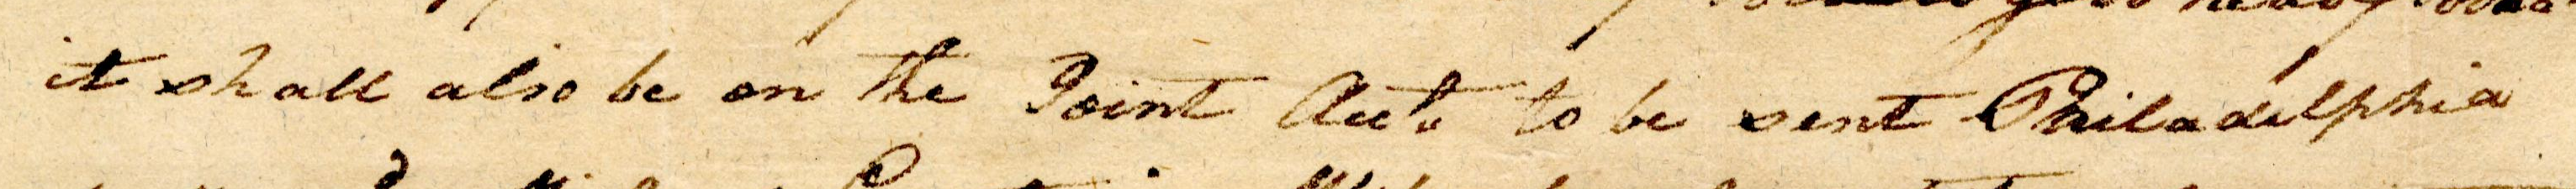it shall also be on the Point Acc^t. to be sent Philadelphia
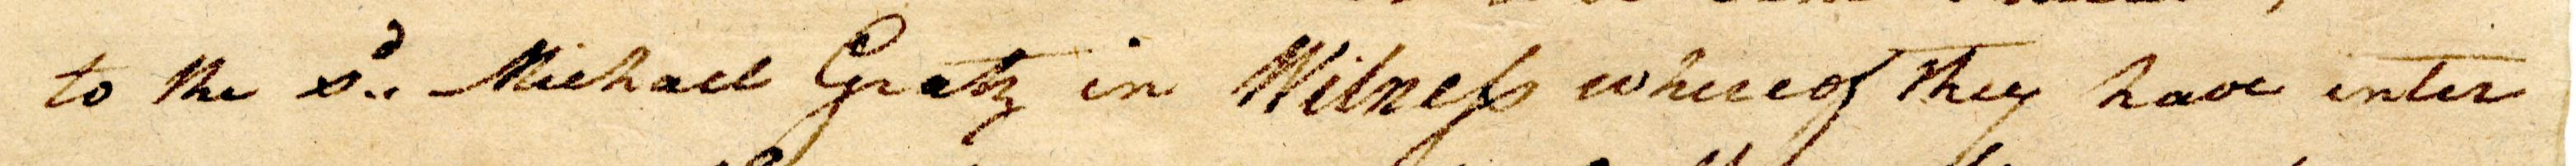to the s^d. Michael Gratz in Witness whereof they have enter
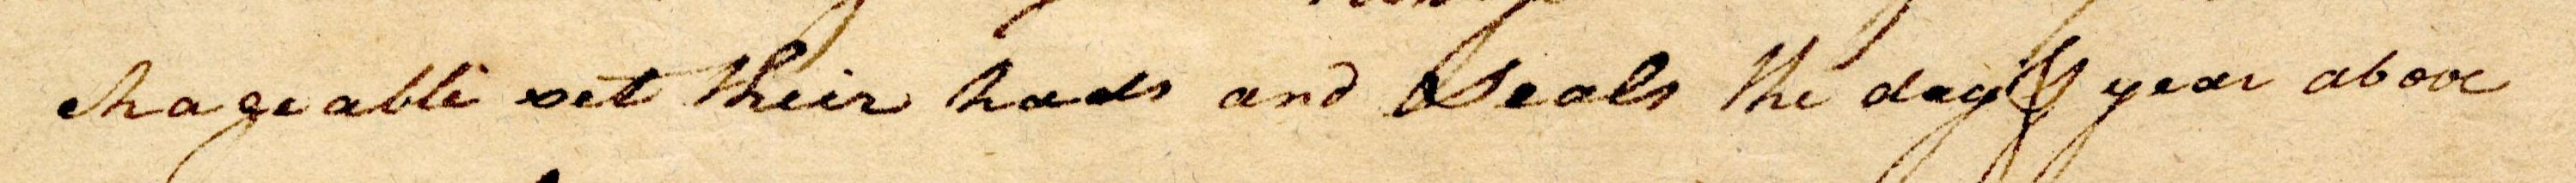shageable set their hands and seals the deg^y year above
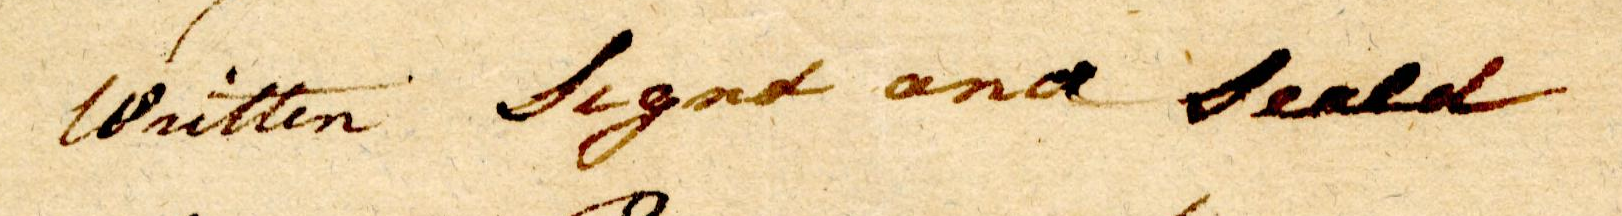Written Signd and seald
